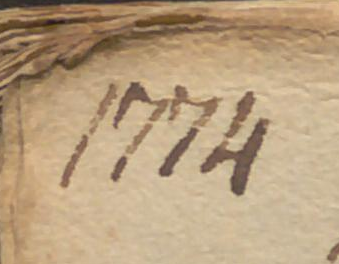1774
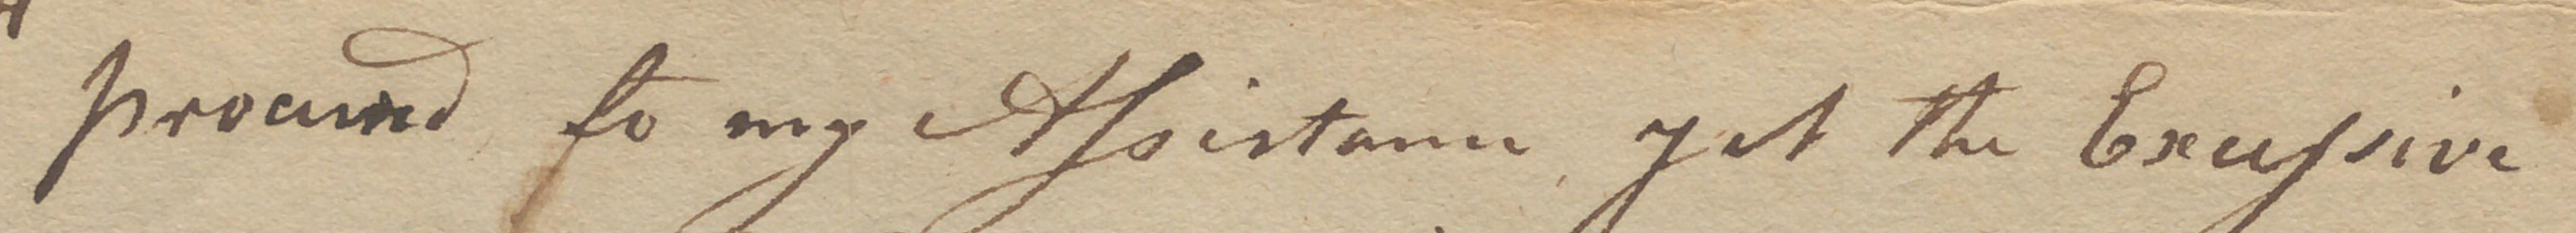procured to my Assistance yet the Excessive
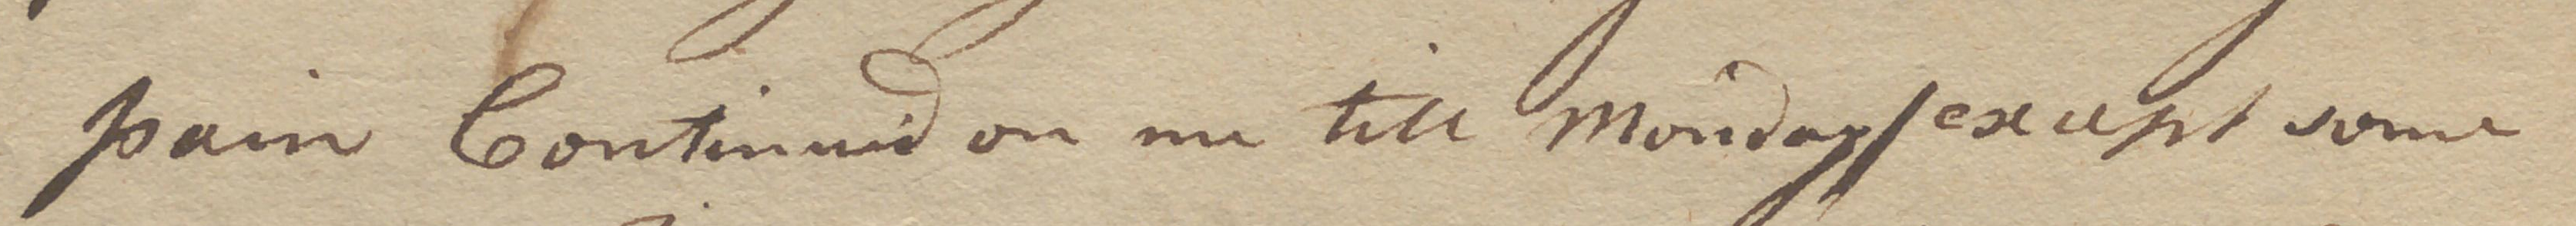pain Continued on me till Monday / except some
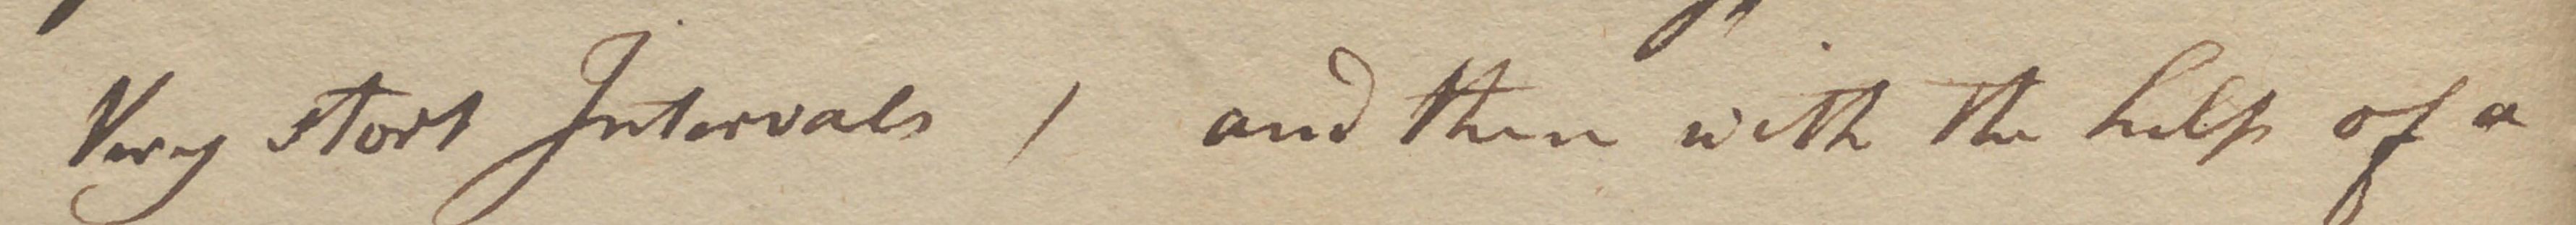Very stort Intervals, and then with the help of a
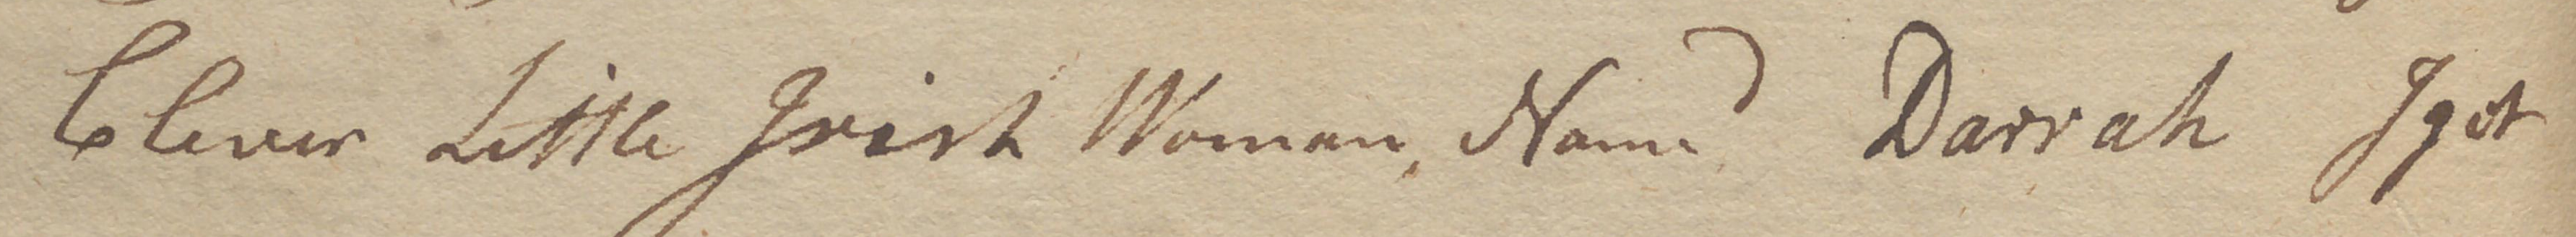Clever Little Irish Woman, Nam^d Darrah I got
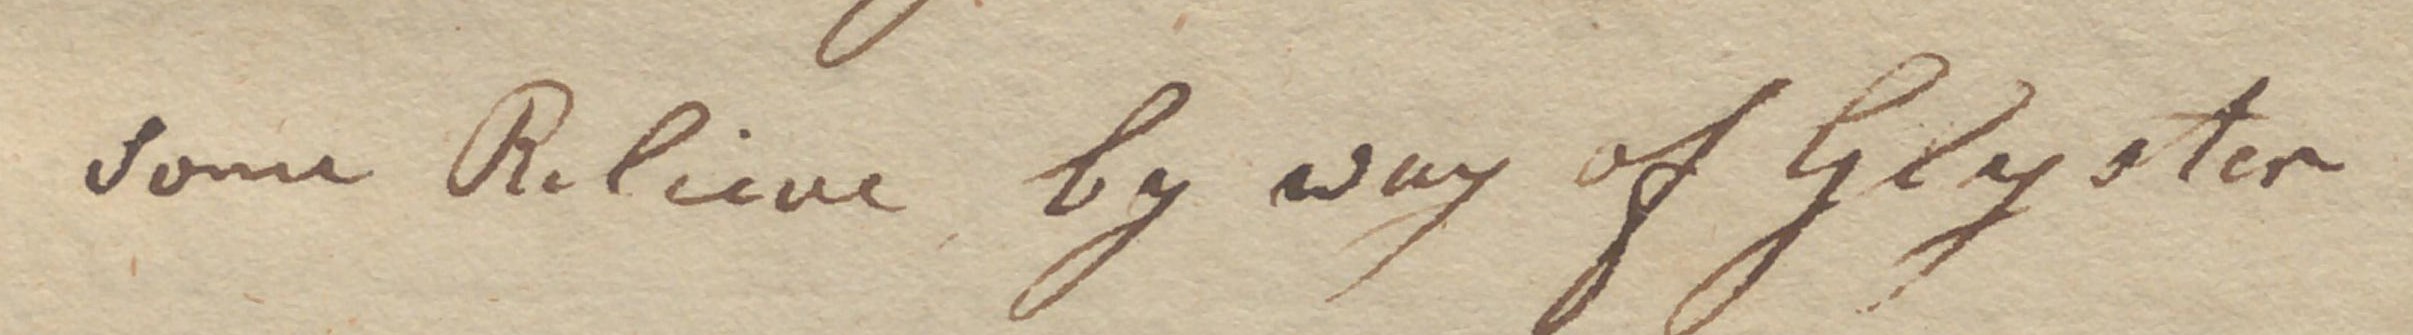sone Relieve by way of Glyster
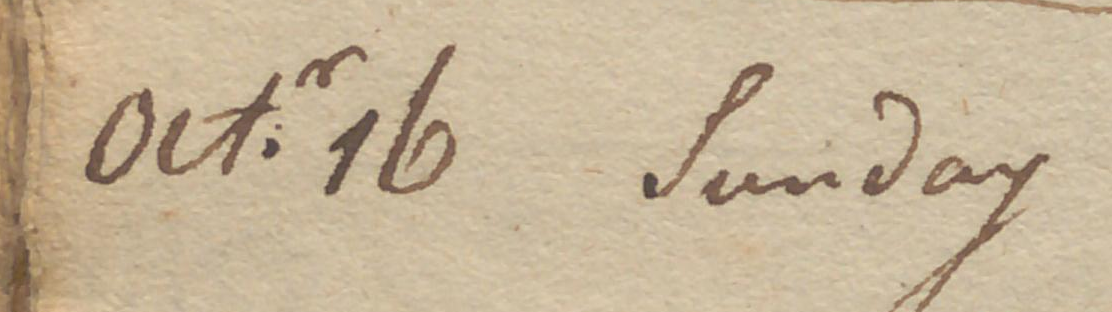Oct^r. 16 Sunday
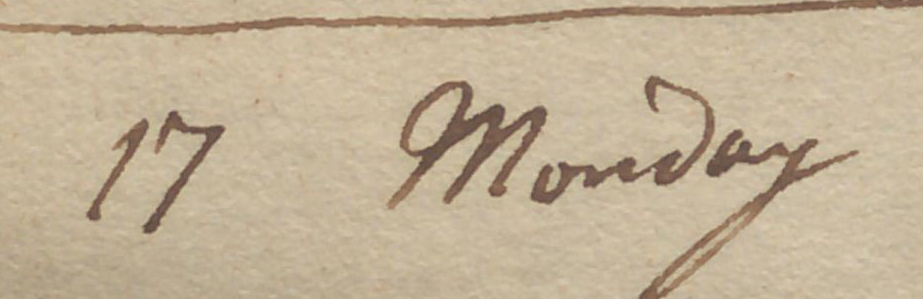17 Monday
